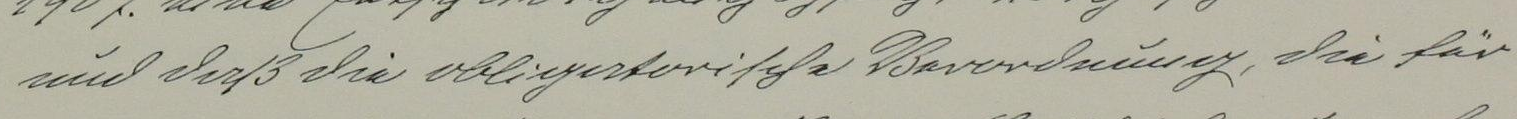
und daß die obligatorische Verordnung, die für
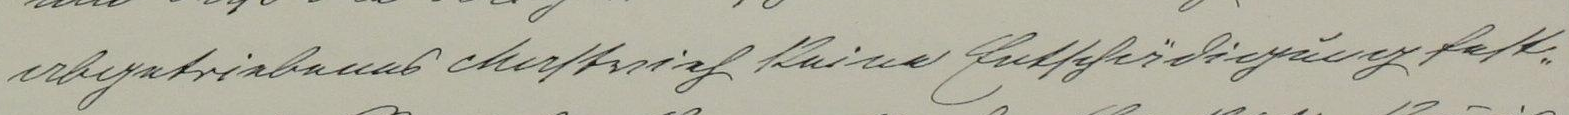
abgetriebenes Mastvieh keine Entschädigung fest-
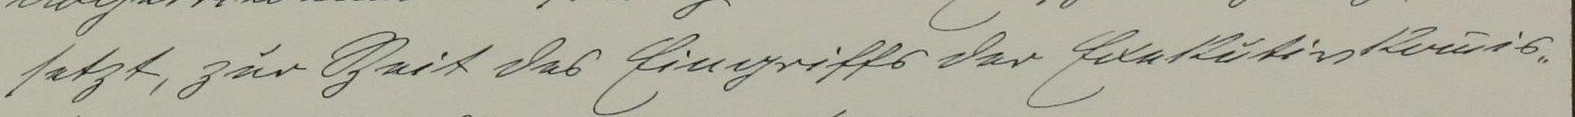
setzt, zur Zeit des Eingriffs der Exekutivkommis-
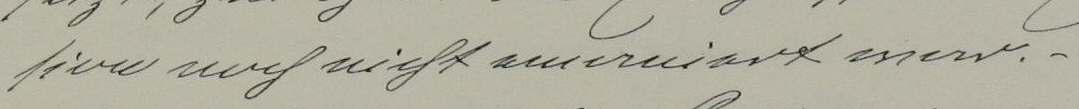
sion noch nicht emaniert war.
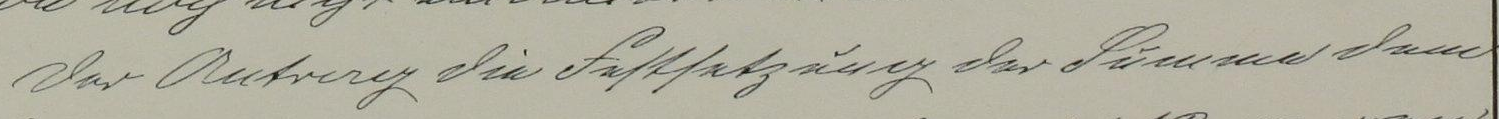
Der Antrag die Festsetzung der Summe dem
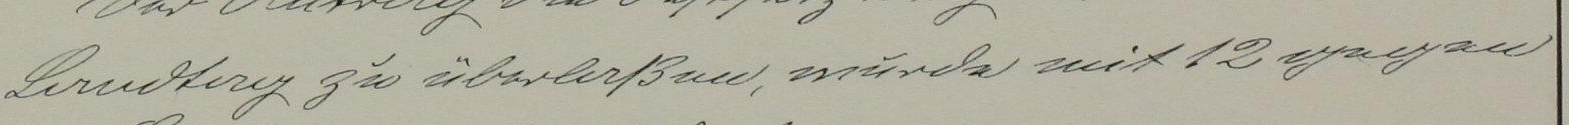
Landtag zu überlaßen, wurde mit 12 gegen
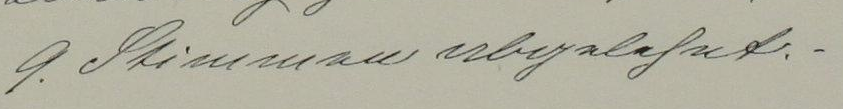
9 Stimmen abgelehnt.
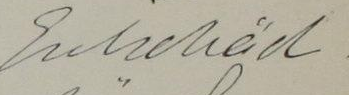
Entschäd
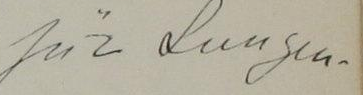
für Lungen-
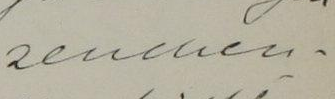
seuchen
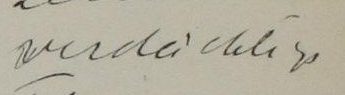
verdächtige
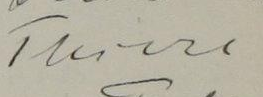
Thiere
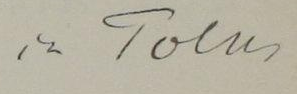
in Tolks
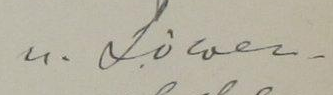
u. Löwen
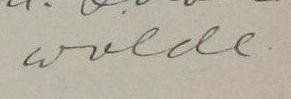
wolde
